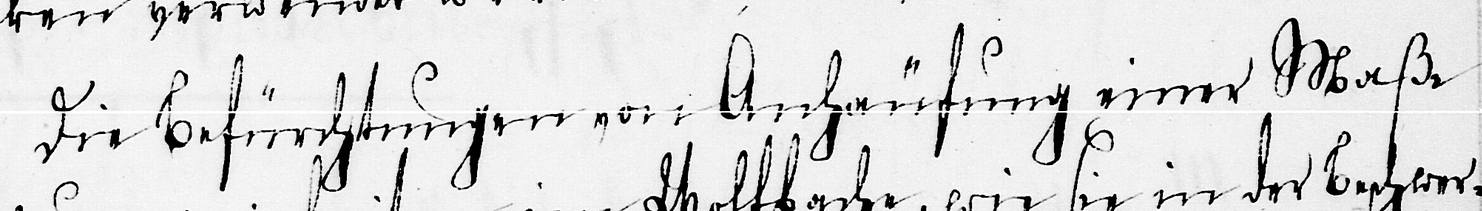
Die Befürchtungen von Anhäufung einer Maße
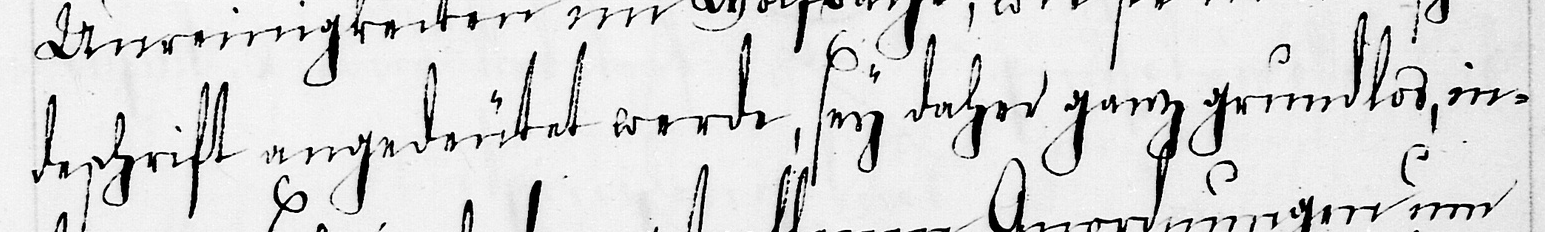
deschrift angedeutet werde, sey daher ganz grundlos, in¬
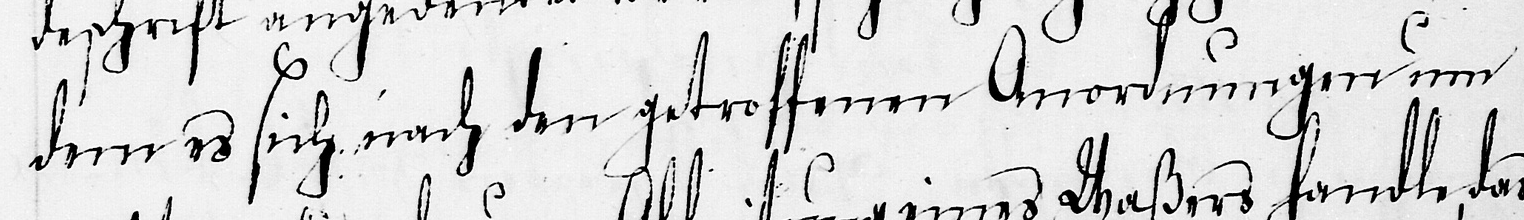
dem es sich nach den getroffenen Anordnungen um
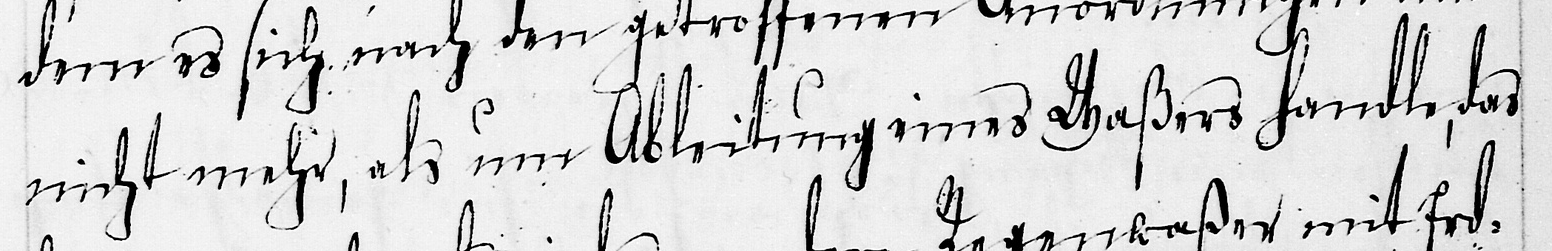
nicht mehr, als um Ableitung eines Waßers handle, das
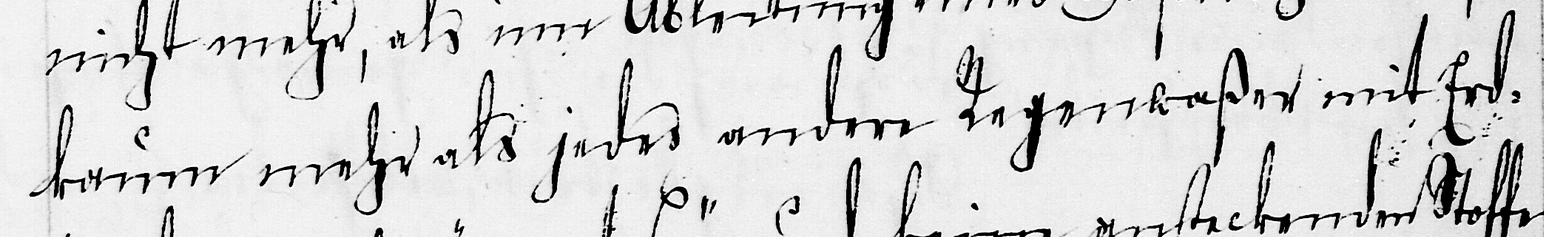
kaum mehr als jedes andere Regenwaßer mit Erd¬
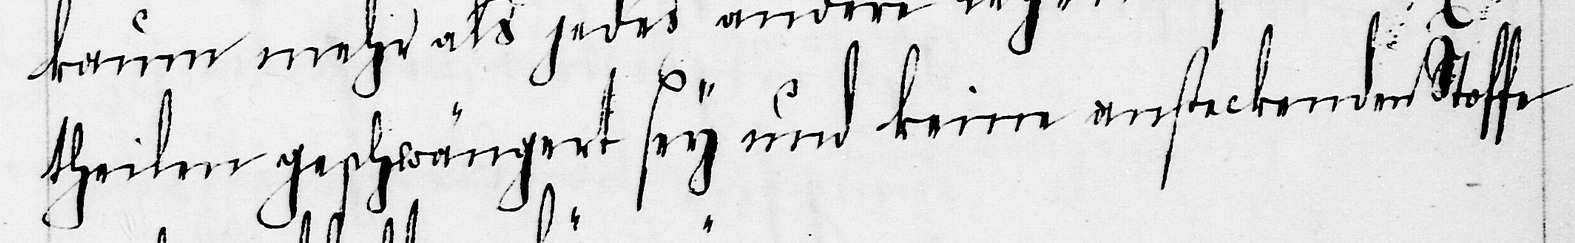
theilen geschwängert sey und keine ansteckenden Stoffe
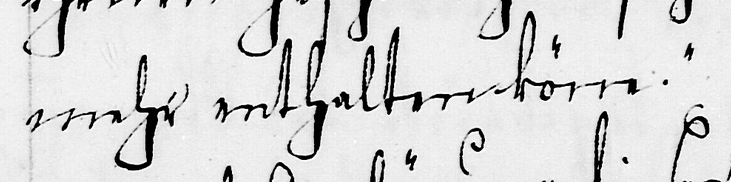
mehr enthalten köne.“
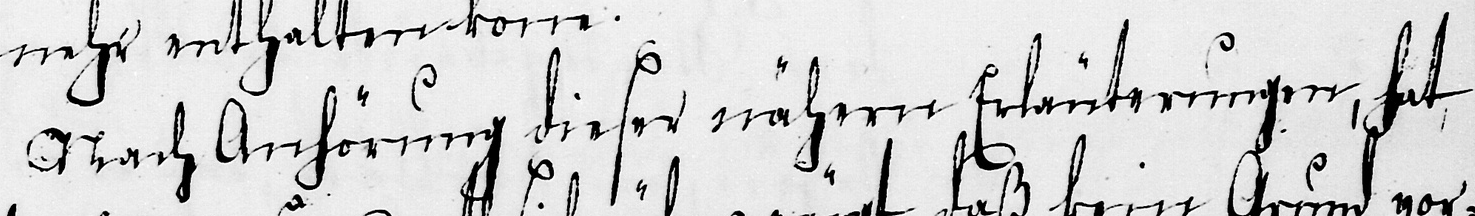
Nach Anhörung dieser nähern Erläuterungen, hat
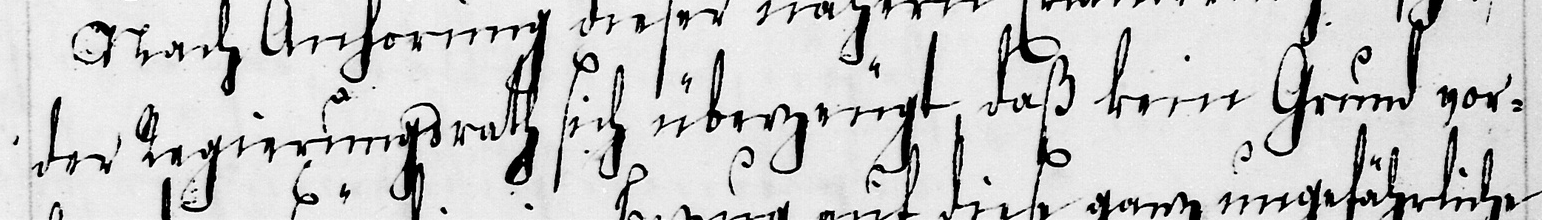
der Regierungsrath sich überzeugt, daß kein Grund vor¬
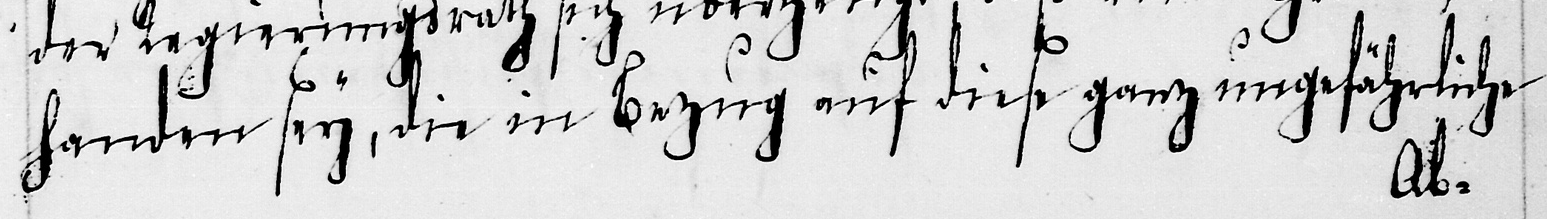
handen sey, die in Bezug auf diese ganz ungefährliche
